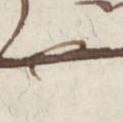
oder aus
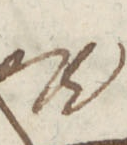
eine
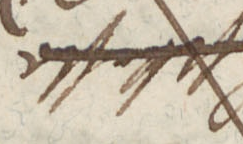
annehmen
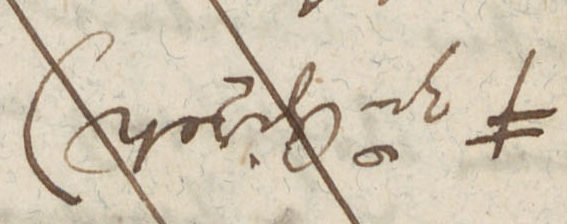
Griechen zu
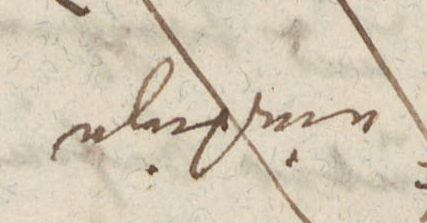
und ihrer
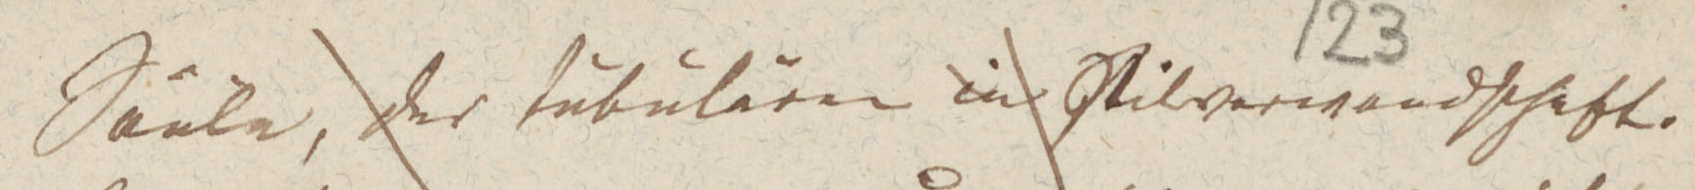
Säule, der tubularen in sStilverwandschaft.
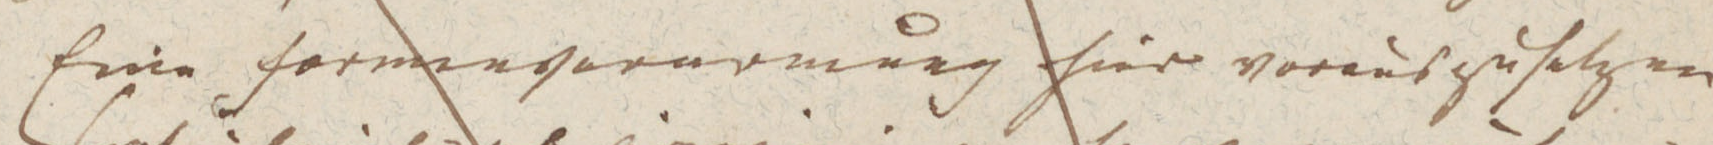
Eine Formenverarmung hier vorauszusetzen
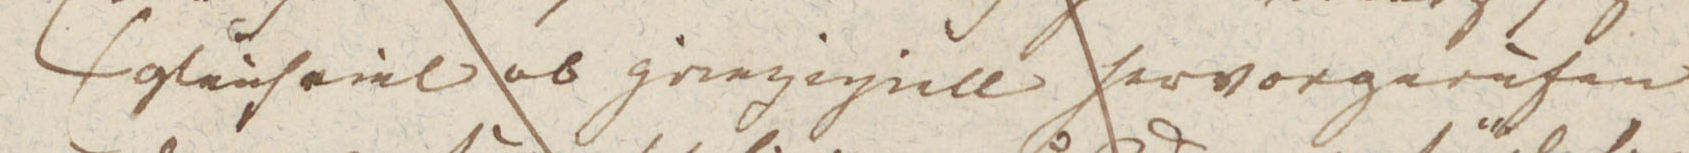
(gleichviel ob prinzipiell hervorgerufen
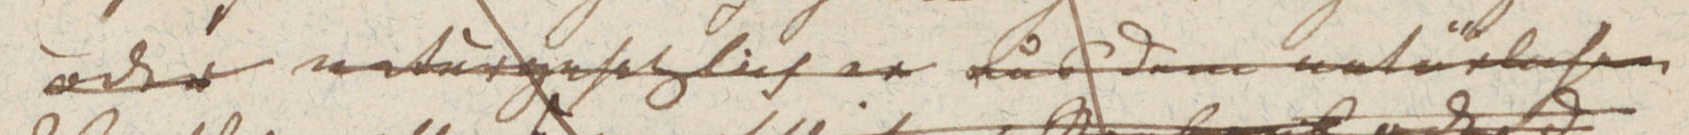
oder naturgesetzlich er aus dem natürlichen
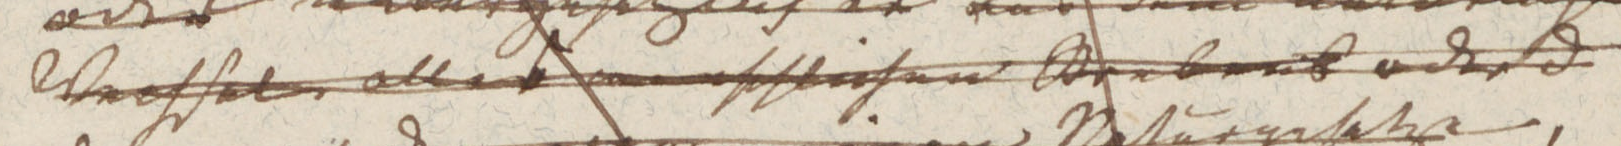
Wechseln alles menschlichen Strebens oder d
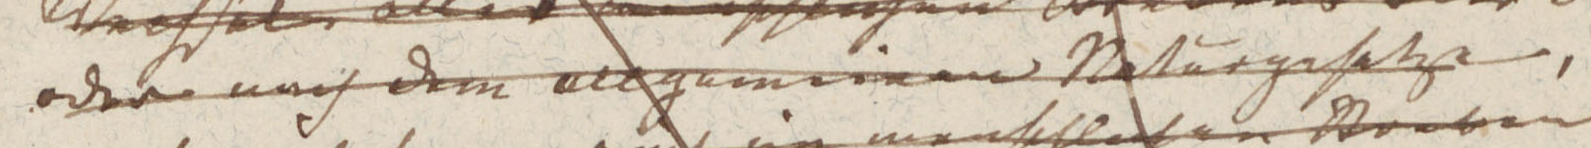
oder nach dem allgemeinen Naturgesetze,
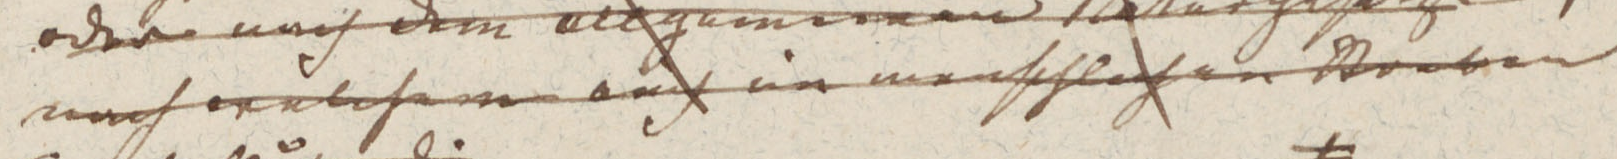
nach welchem auch im menschlichen Streben
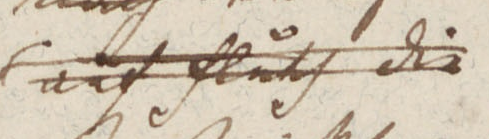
( auf Fluth die
